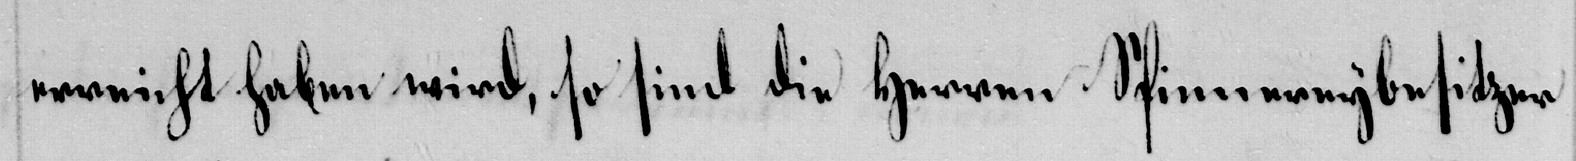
erreicht haben wird, so sind die Herren Spinnereybesitzer
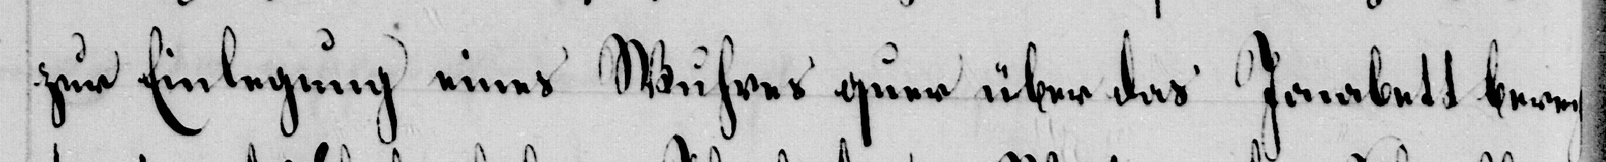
zur Einlegung eines Wuhres quer über das Jonabett berec¬
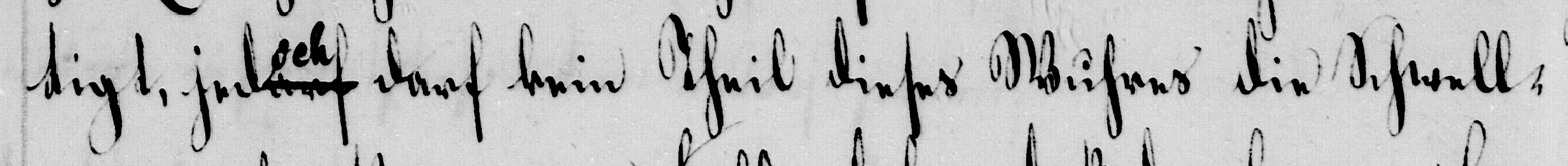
htigt, jedoch darf kein Theil dieses Wuhres die Schwell¬
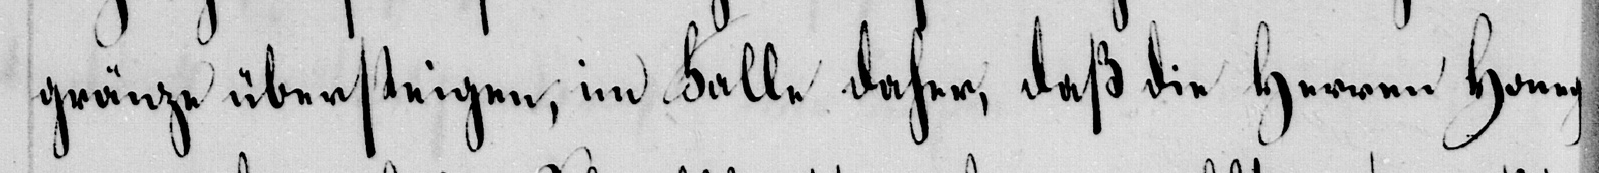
gränze übersteigen, im Falle daher, daß die Herren Honeg¬
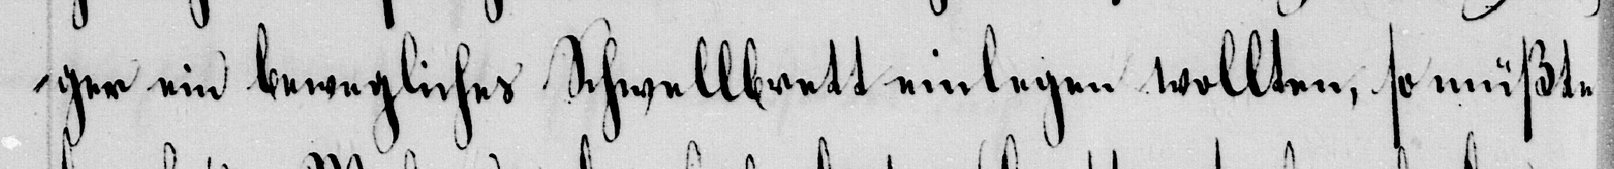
ger ein bewegliches Schwellbrett einlegen wollten, so müßte
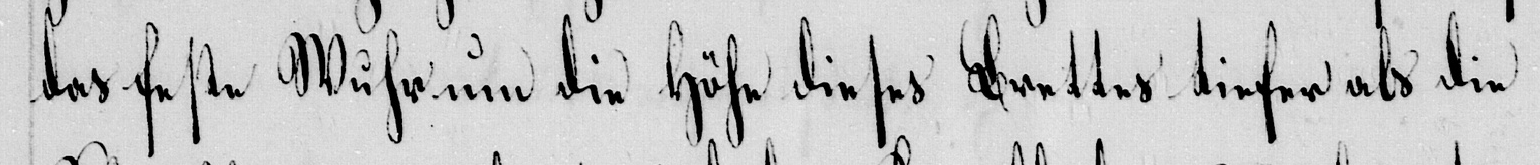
das feste Wuhr um die Höhe dieses Brettes tiefer als die
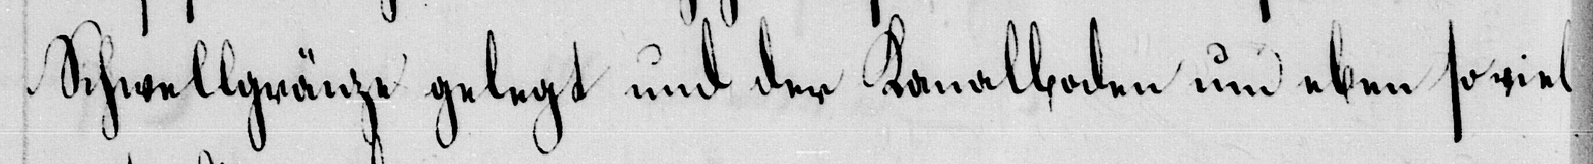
Schwellgränze gelegt und der Kanalboden um eben so viel
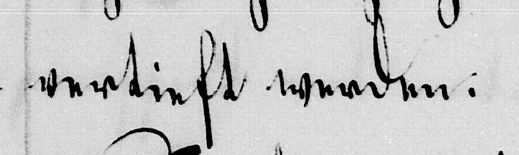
vertieft werden.
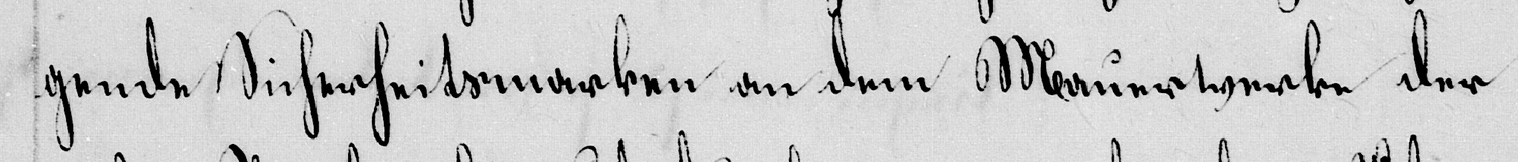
gende Sicherheitsmarken an dem Mauerwerke der
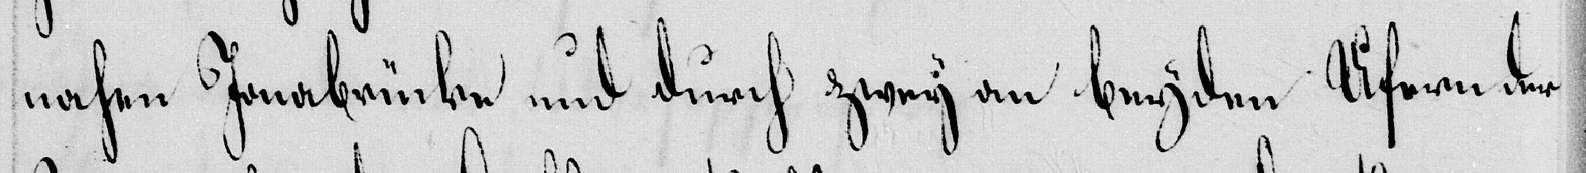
nahen Jonabrücke und durch zwey an beyden Ufern der
